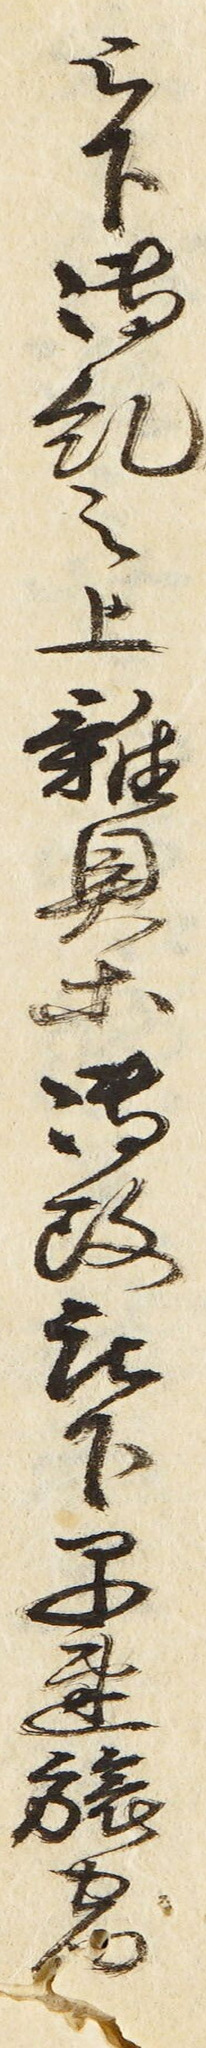被下御糺之上雑具等御改被下早速旅宿
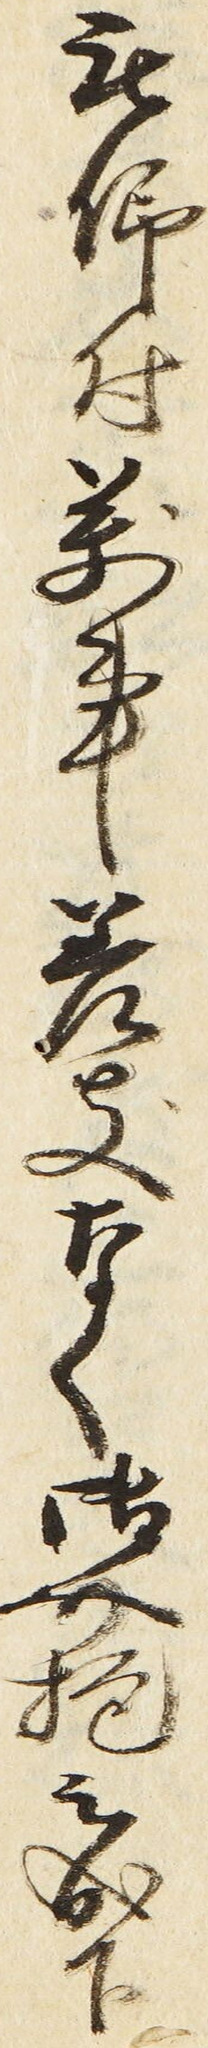被仰付万事差支なく御介抱被成下
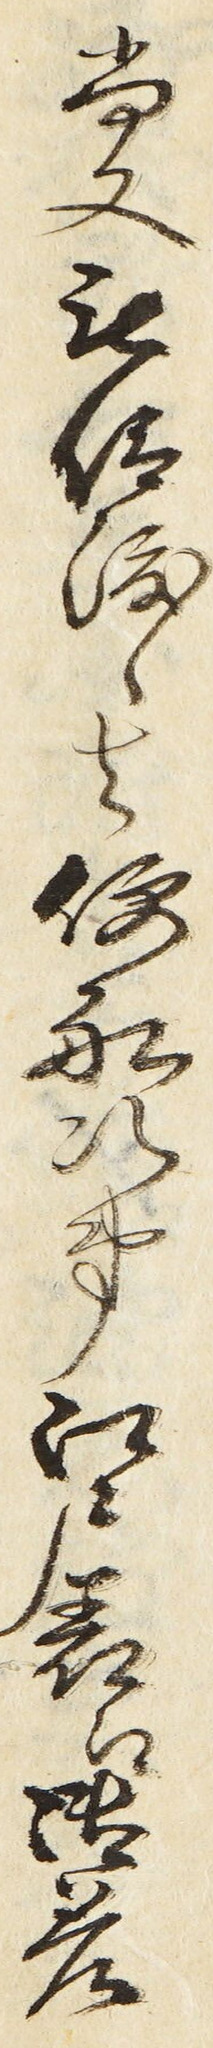尚又被仰渡候者便船次第江戸表江御差
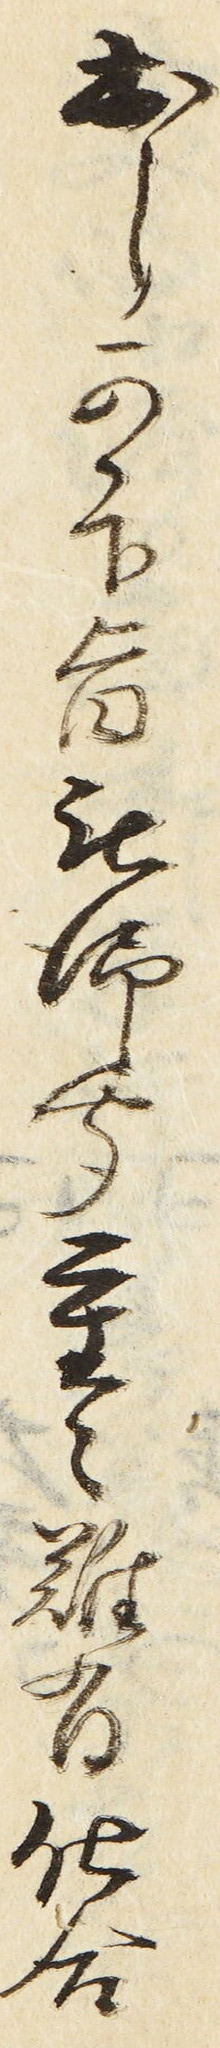出し可被下旨被仰聞重々難有仕合
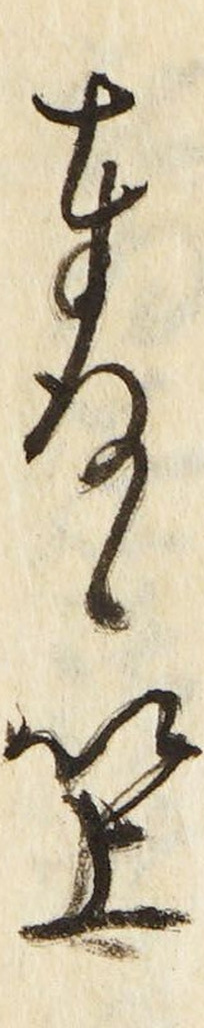奉存候以上
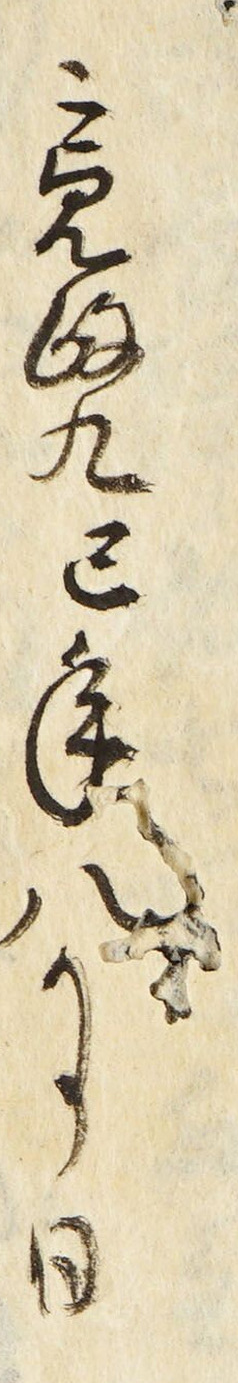寛政九巳年八月日

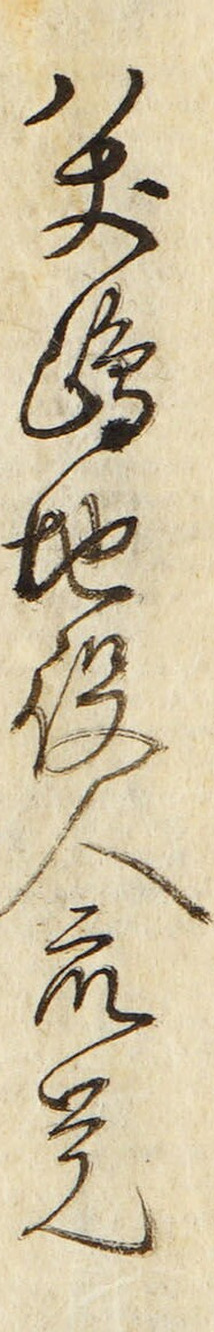八丈嶋地役人衆覚
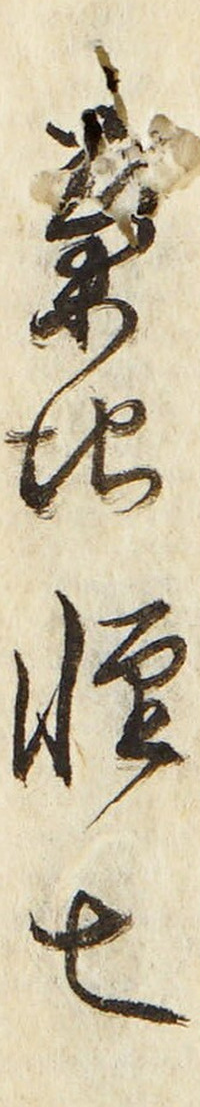菊地軽七
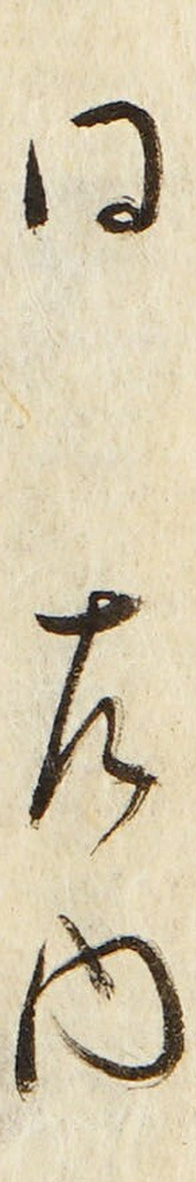同左内
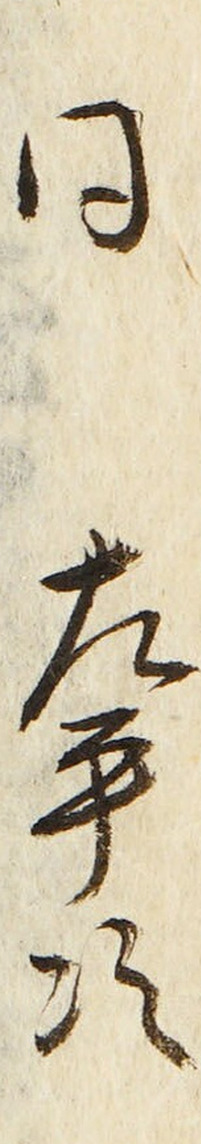同左平次
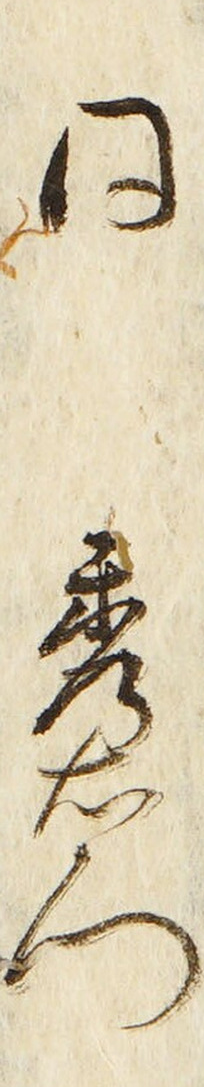同秀右衛門
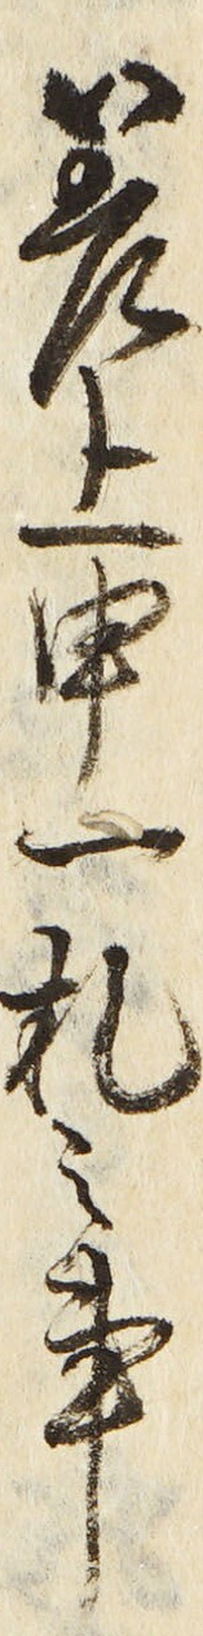差上申一札之事
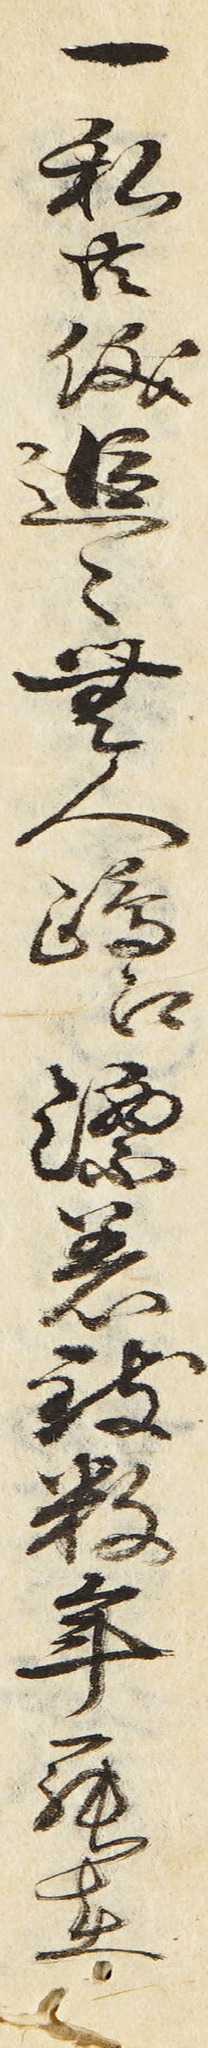一私共儀追々無人島江漂着致数年罷在
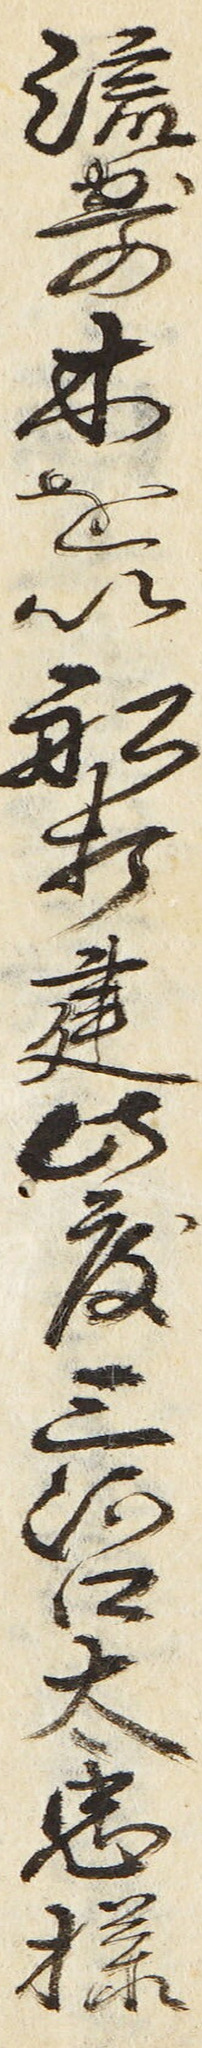流寄木を以船打建此度三河口太忠様
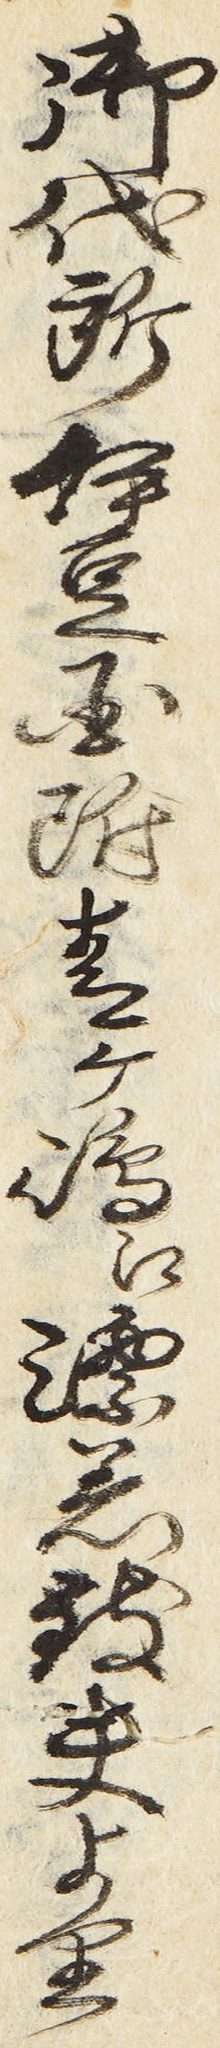御代所伊豆国付青ケ嶋江漂着致夫より
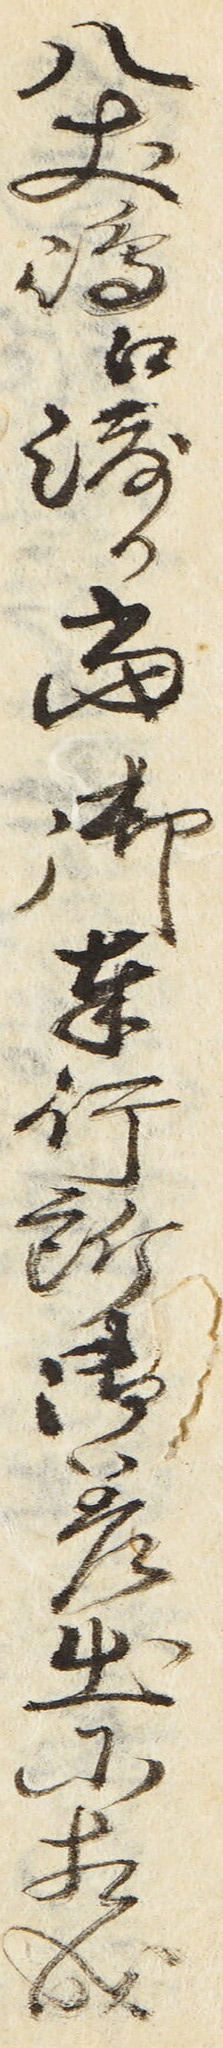八丈嶋江渡り当御奉行所御差出に相成
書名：漂流一件上書
